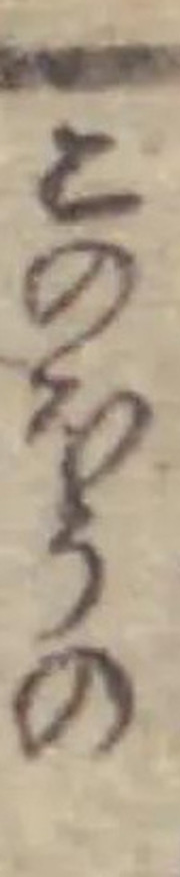このほうの
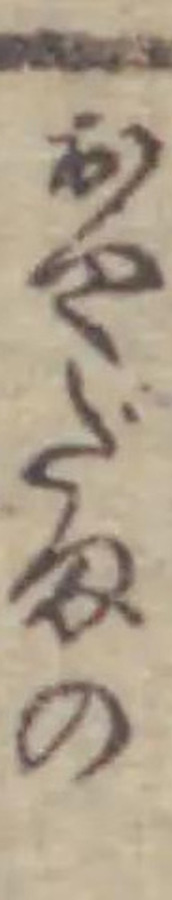おやだまの
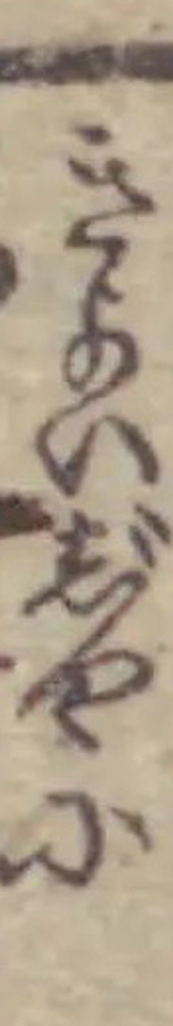きよいじやに
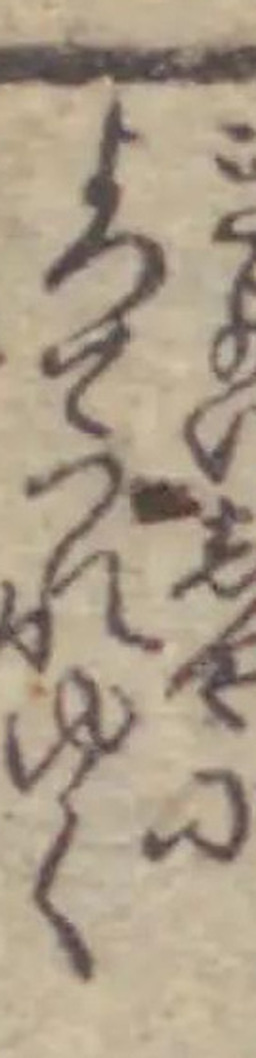よつてつれゆく
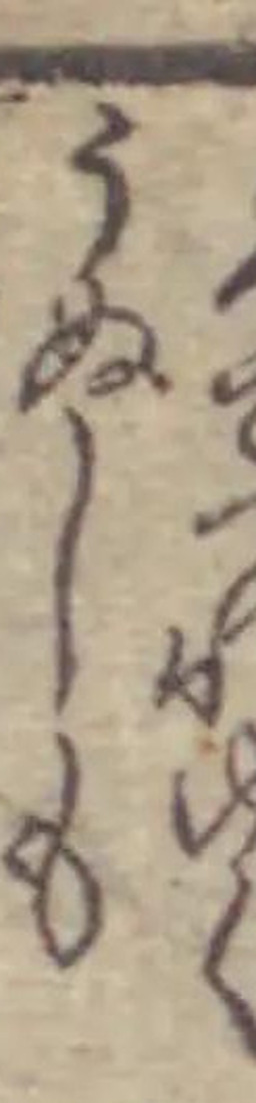うぬしも
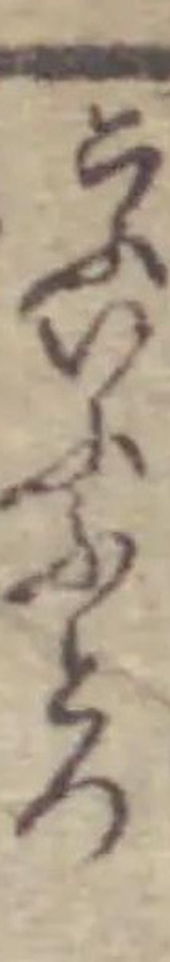こういふふとつ
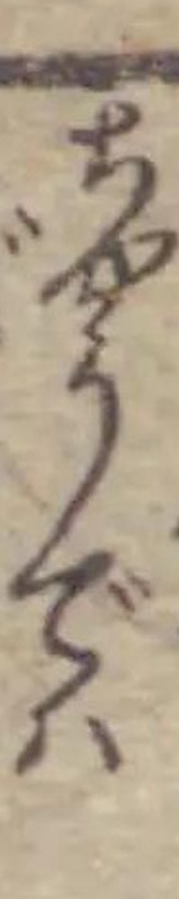ちやうでは
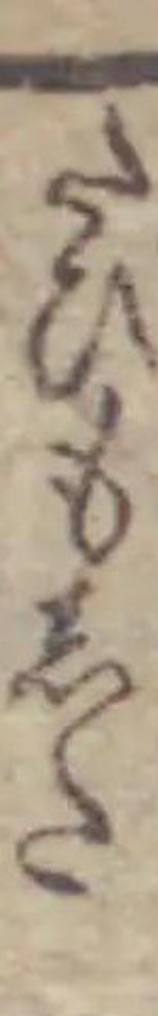たびもした
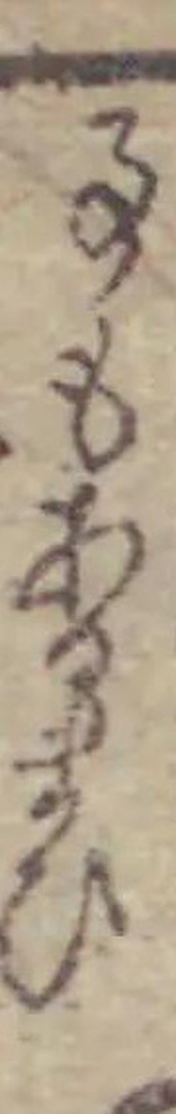事もあるまひ
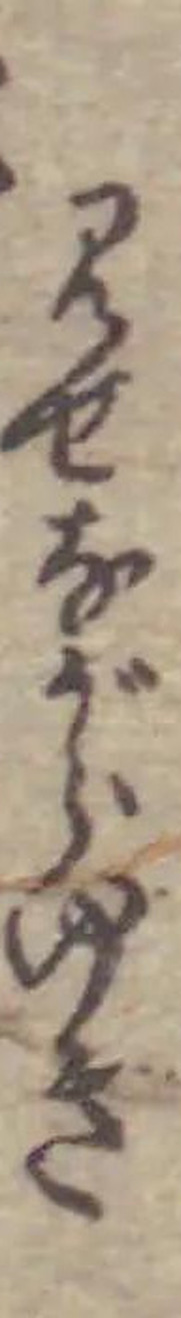見せながらゆき
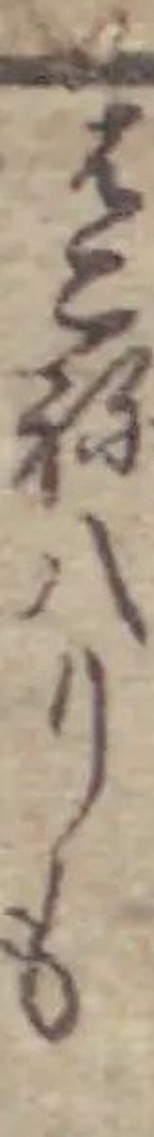はこね八りも
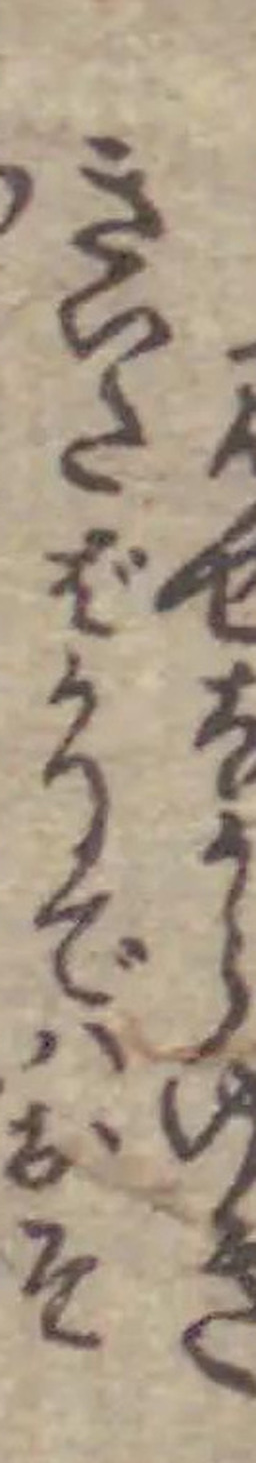きいたばかりではおそ
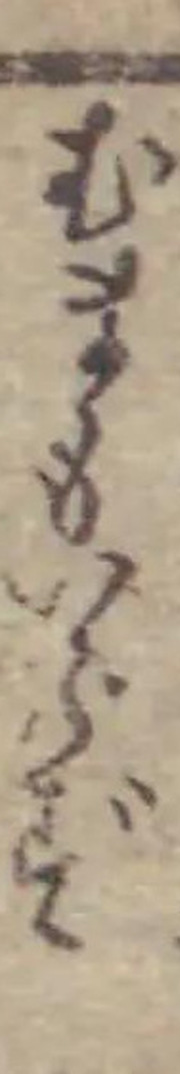むまもいらず
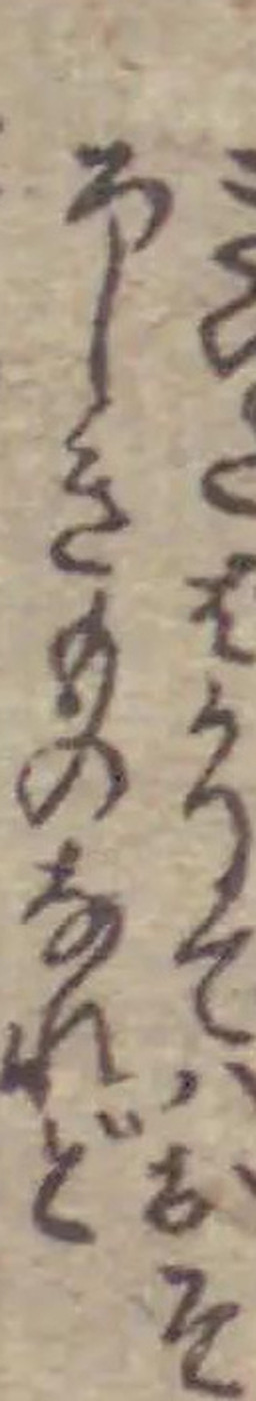ろしきものなれど
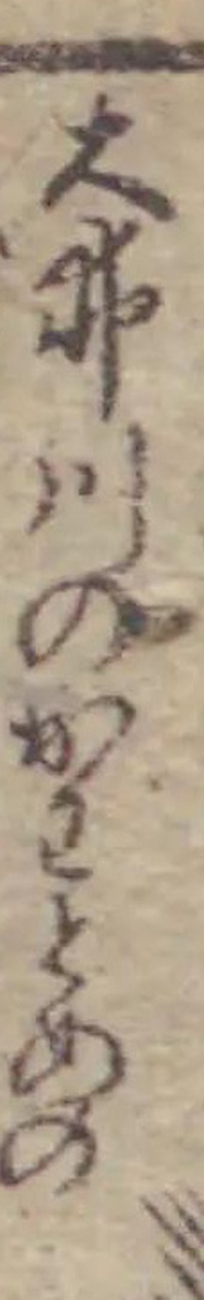大井川のかわとめの
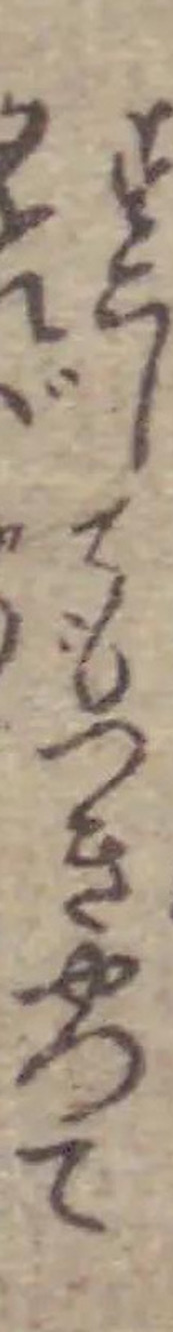すこしてもつきやつて
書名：珍説女天狗 2巻
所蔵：国立国会図書館 National Diet Library, JAPAN
